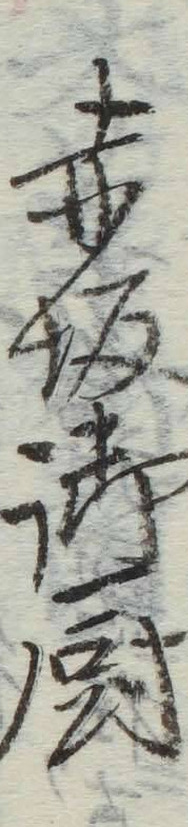赤坂御厨
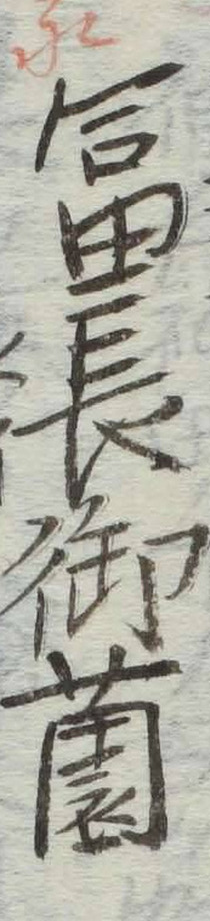冨長御薗
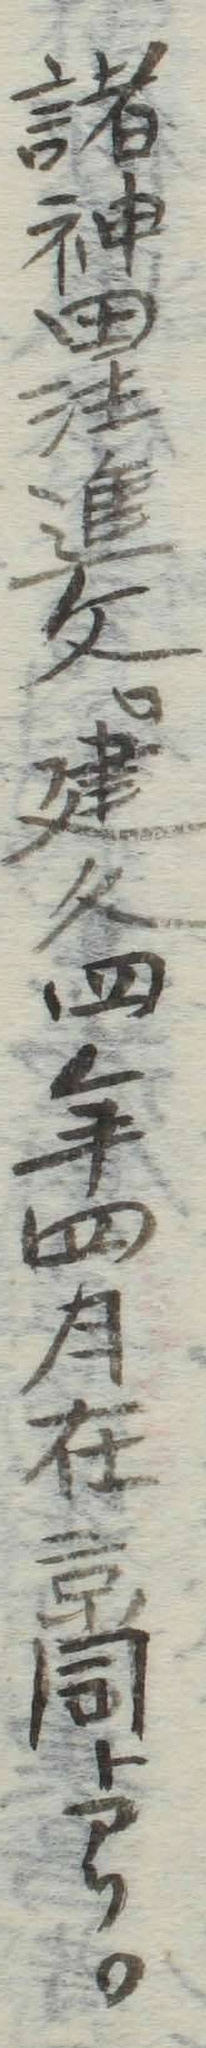諸神田注進文。建久四年四月在京同トアリ。
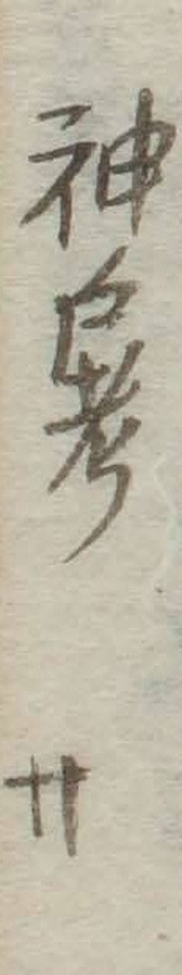神戸考廿

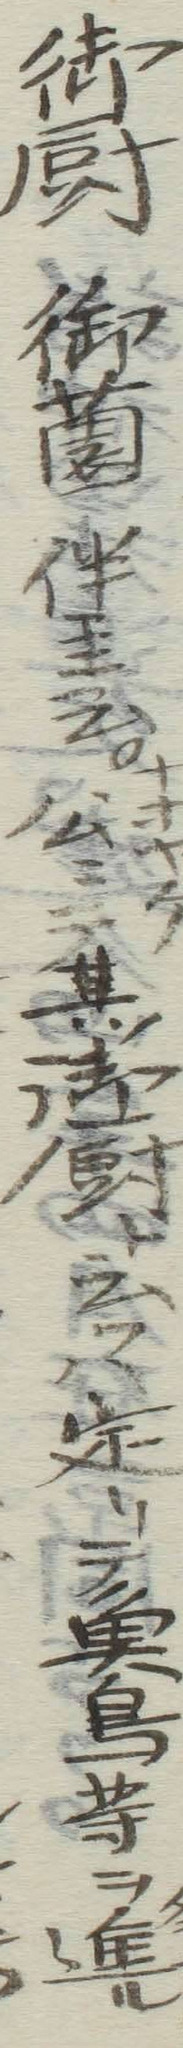○御厨御薗伴主云。公ニテ其御厨ト云フハ定リテ魚鳥等ヲ進ル
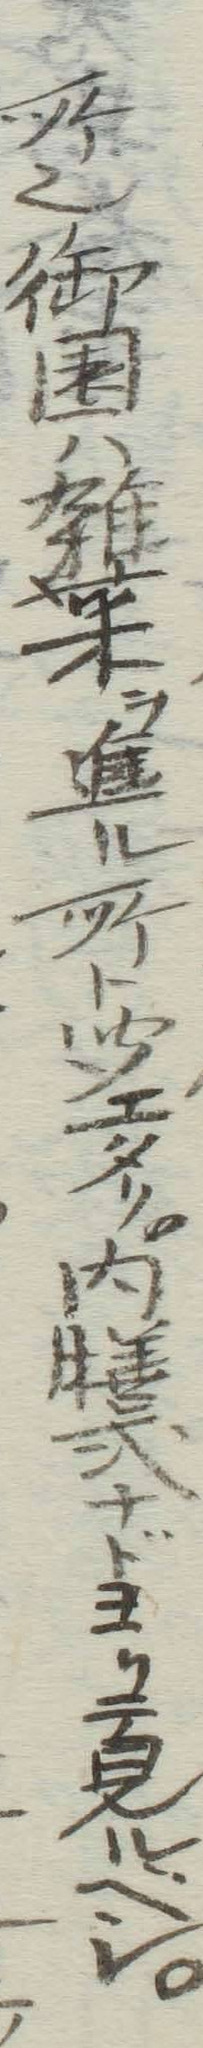所也御園ハ雑菜ヲ進ル所ト聞エタリ。内膳式ナドヨリテ見ルベシ。
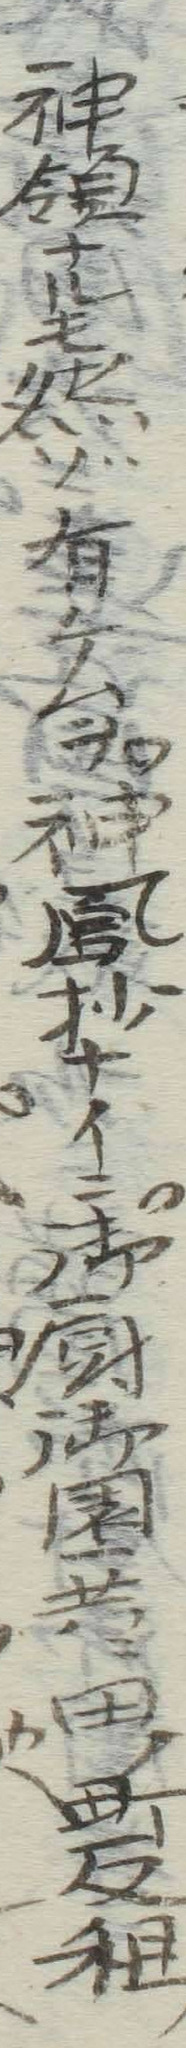神領ナルモ然ゾ有ケムヲ。神鳳抄ナイニ。御厨御園共ニ田ノ町反租ノ
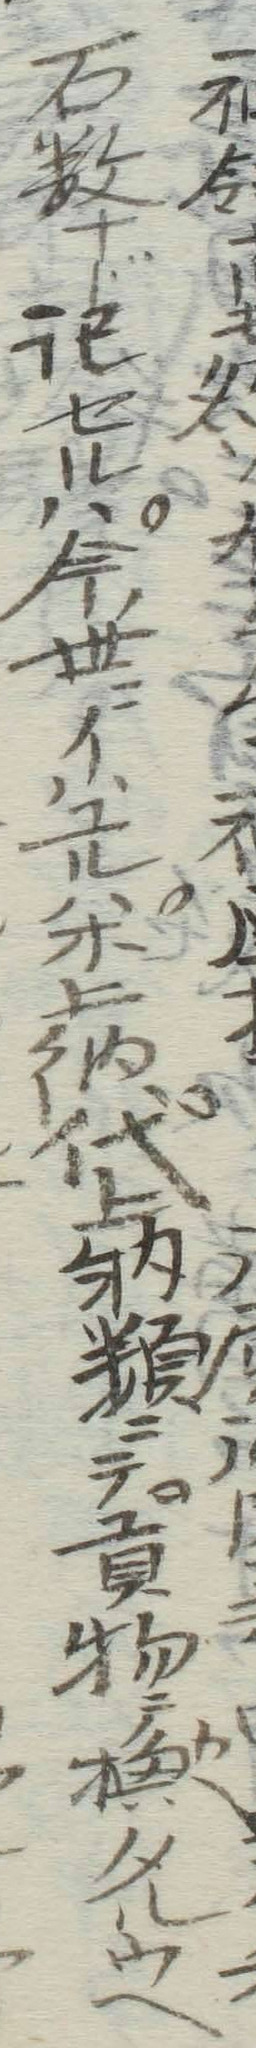石数ナド記セルハ。今世イハユル。米上納。代上納類ニテ。貢物ニ換タルウヘ
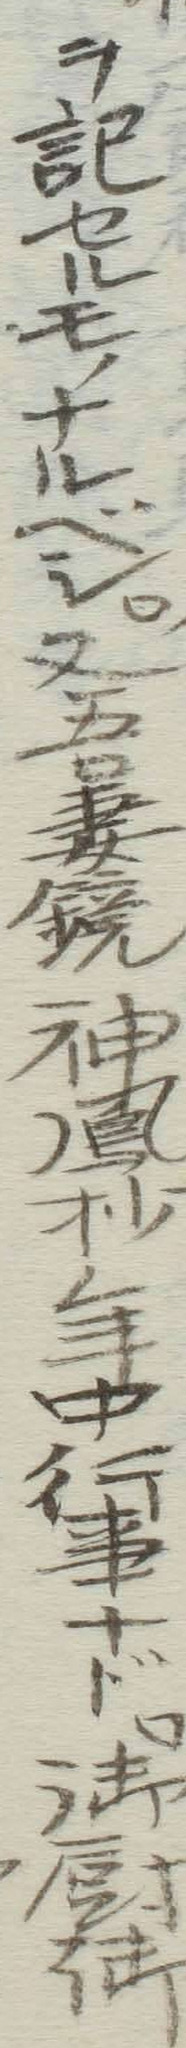ヲ記セルモノナルベシ。又吾妻鏡神鳳抄年中行事ナド。御厨御
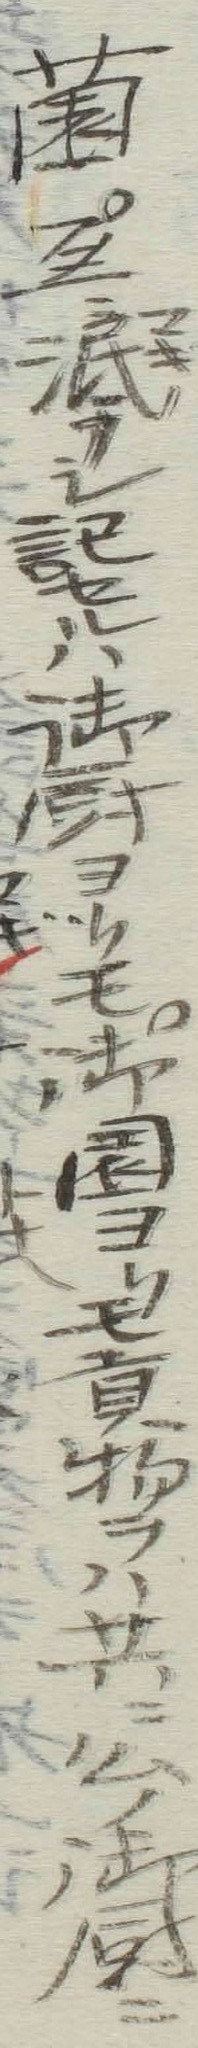薗。互ニ泯ラシ記セルハ御厨ヨリモ。御園ヨリモ貢物ヲハ共ニ公ノ御厨ニ
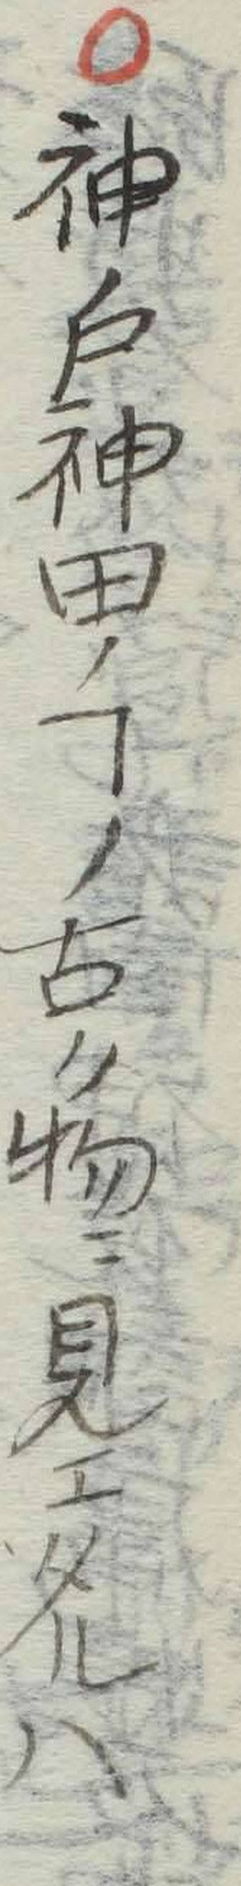○神戸神田ノコトノ古ク物ニ見エタルハ
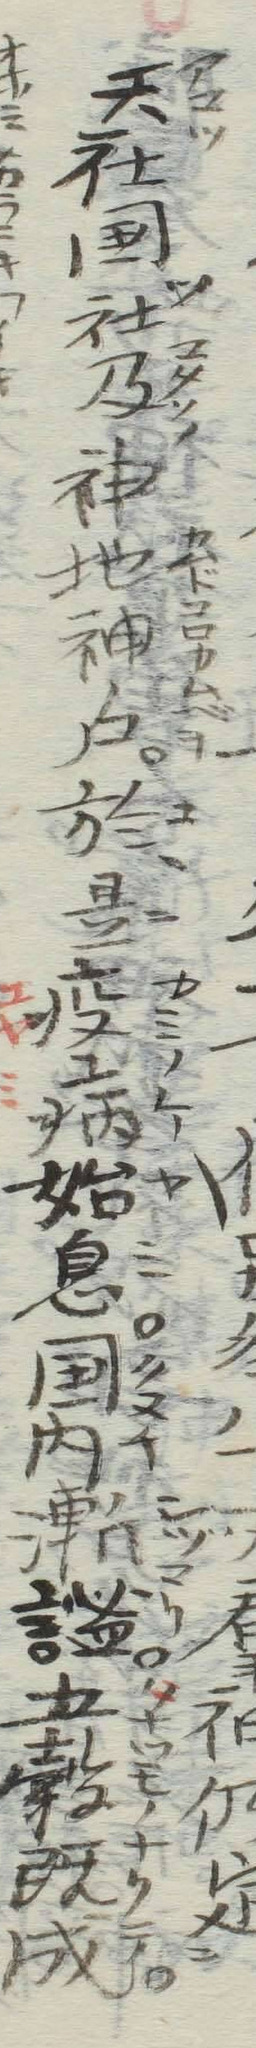天社国社及神地神戸。於是疫病始息。国内漸謐。五穀既成。

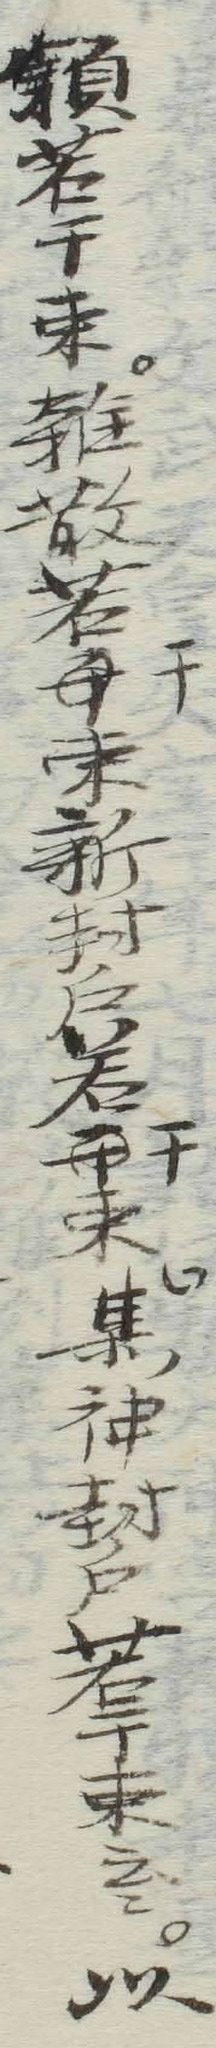穎若干束。雑散若干束新封戸若干束。某神封戸若干束云々。以

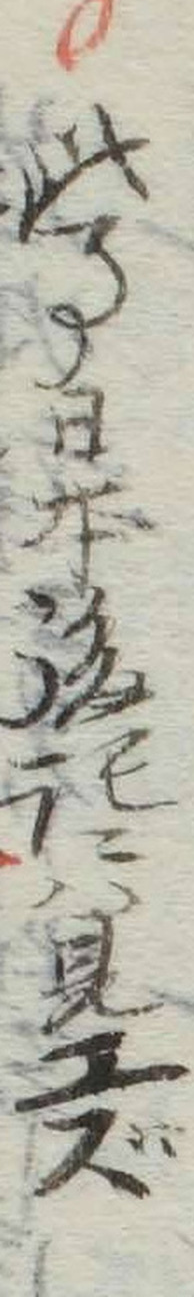○此事日本後記ニハ見エズ

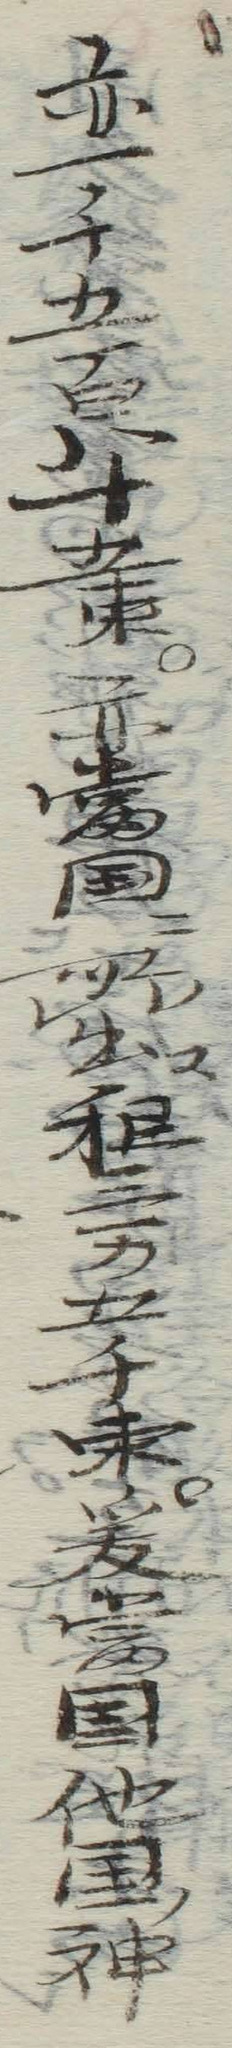亦一千五百八十五束。亦当国所出租三万五千束。爰当国他国神
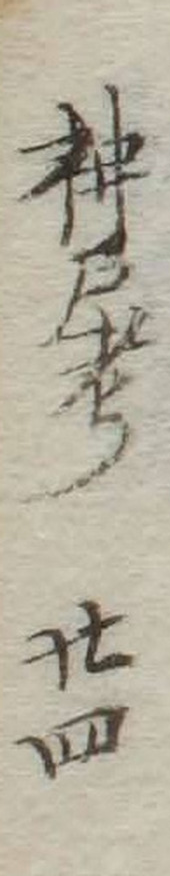神戸考廿四
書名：神戸御厨御薗考
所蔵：国文学研究資料館
